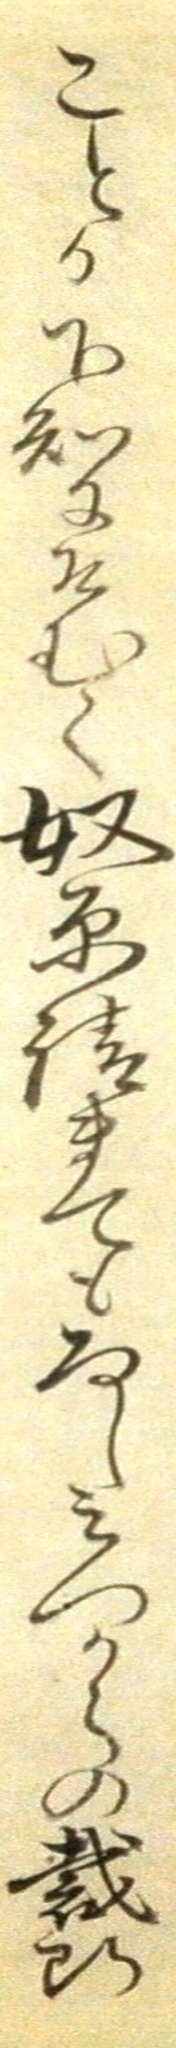ことか下知にそむく奴原請まてもなしみつからの裁断
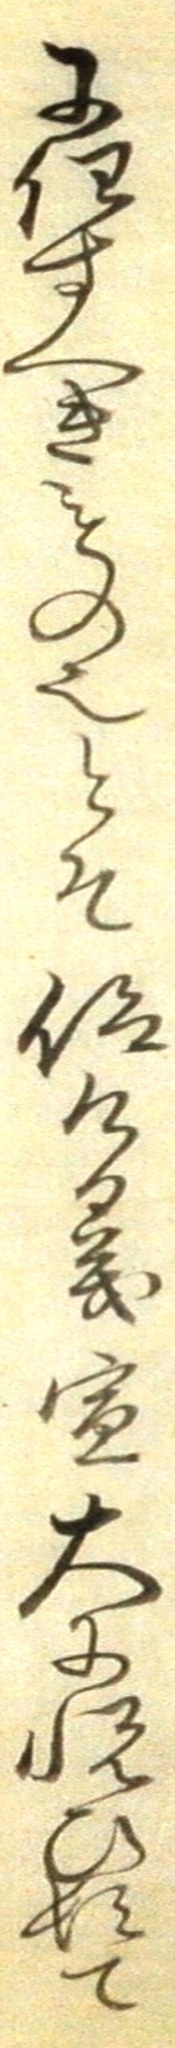に任すへきもの也とそ仰ける義宣大に悦ひ頓て
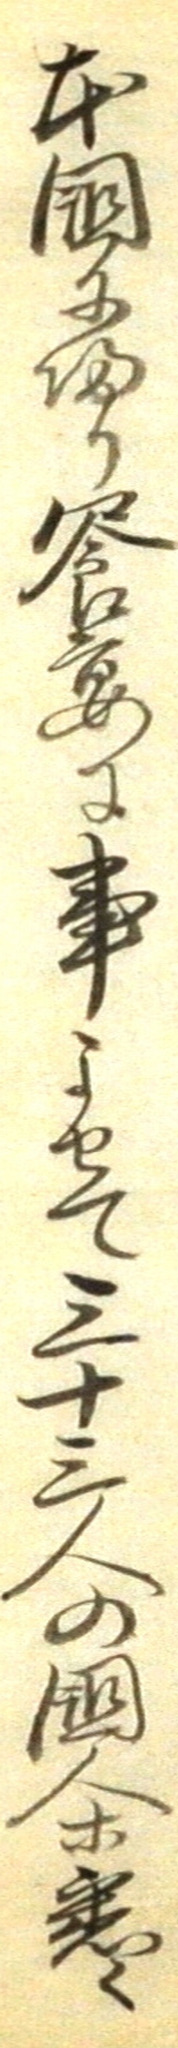本国に帰り饗宴に事よせて三十三人の国人等悉く
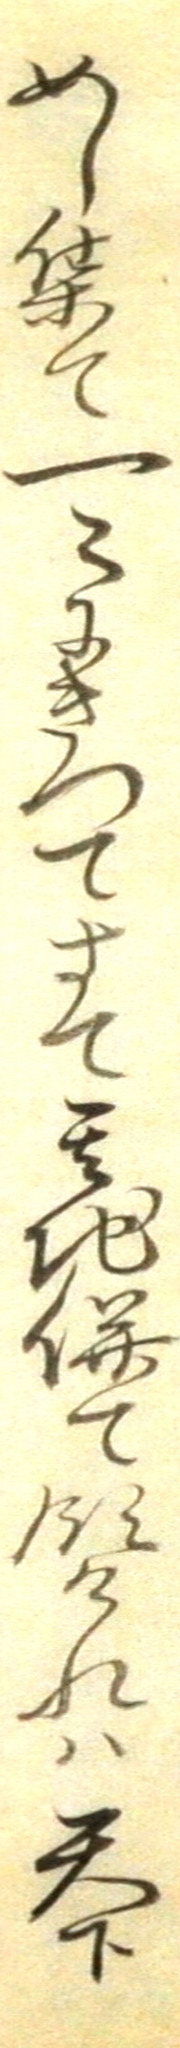めし集て一々にきつてすて其地併て領けれは天下
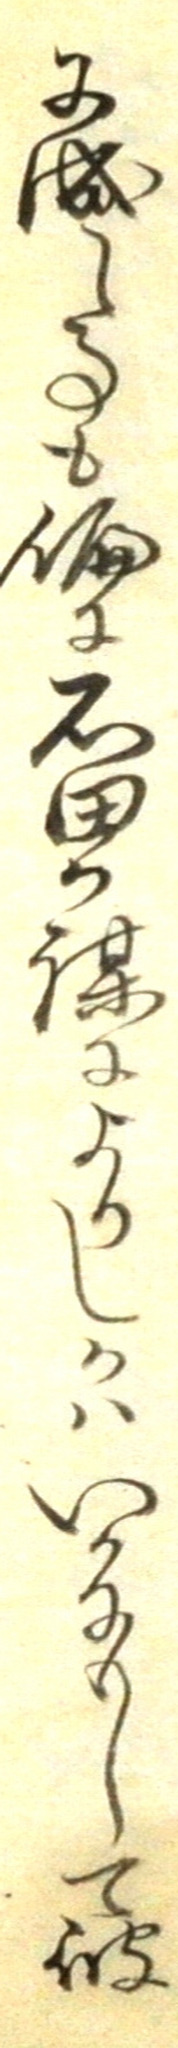に成し事も偏に石田か謀によりしかはいかにもして彼
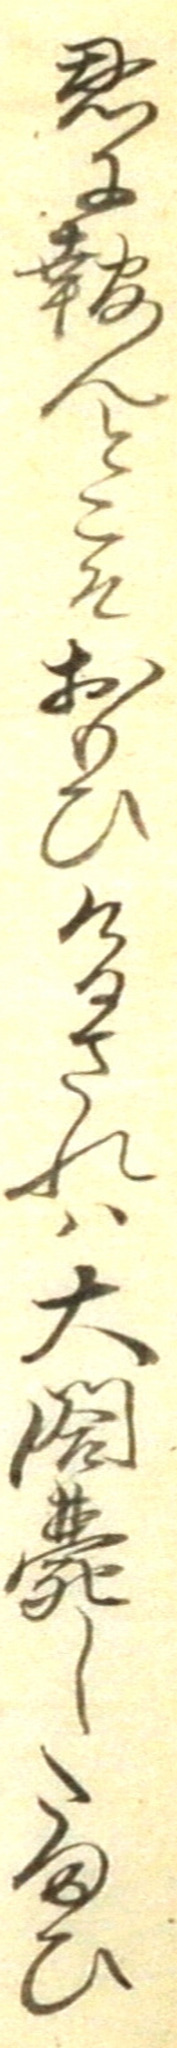恩に報んとこそおもひけるされは大閤薨したまひ
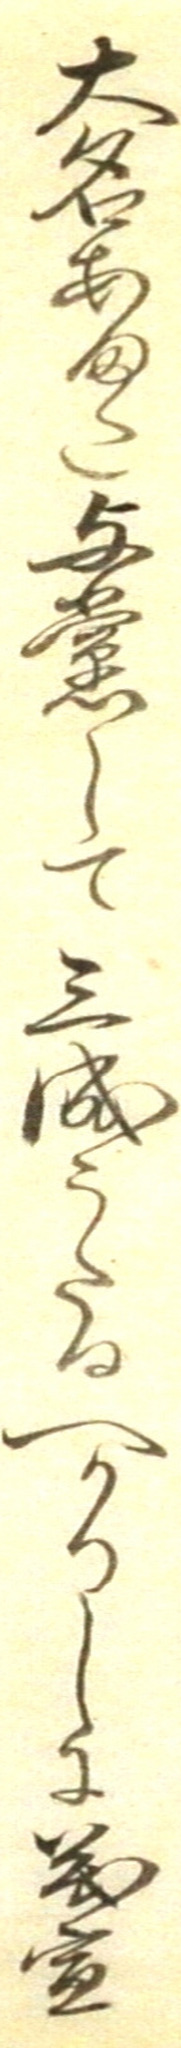大名あまた与党して三成うたるへかりしに義宣
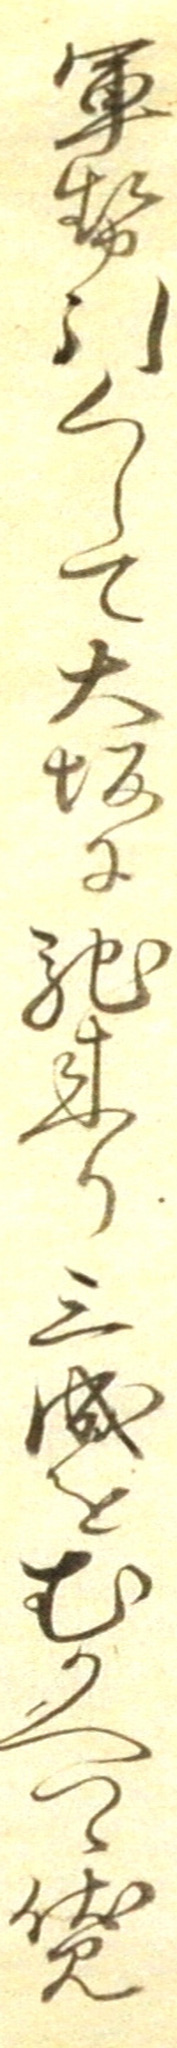軍勢引くして大坂に馳来り三成をむかへつゝ伏見
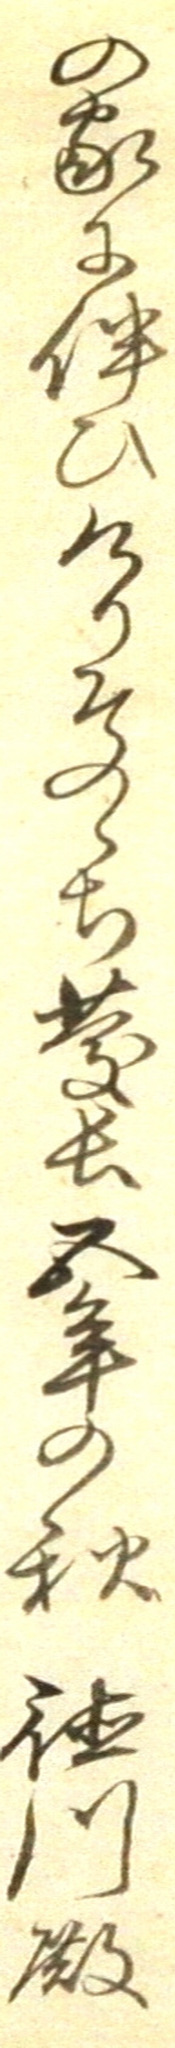の家に伴ひけりそのゝち慶長五年の秋徳川殿
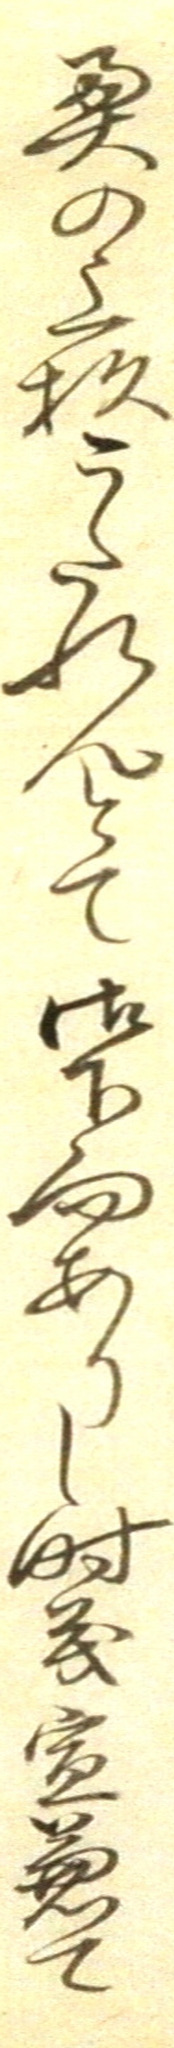奥の上杉うたれんとて御下向ありし時義宣兼て
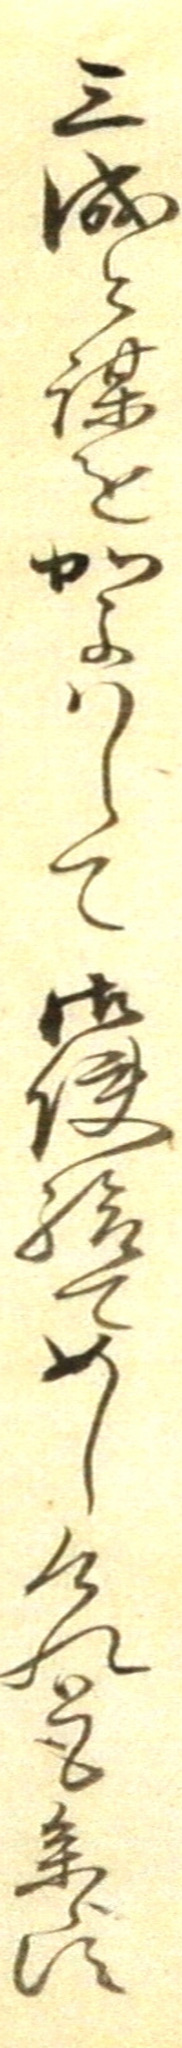三成と謀をかよはして御使給てめしけれとも参らす
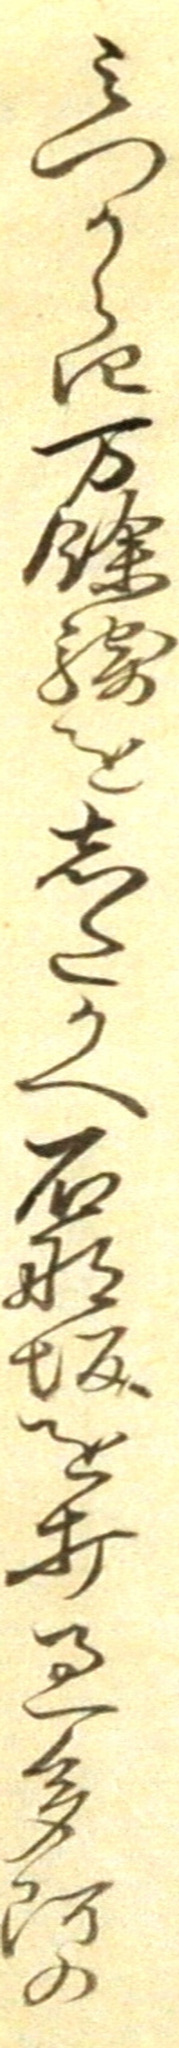みつから四万余騎をしたかへ石那坂を打過多阿の
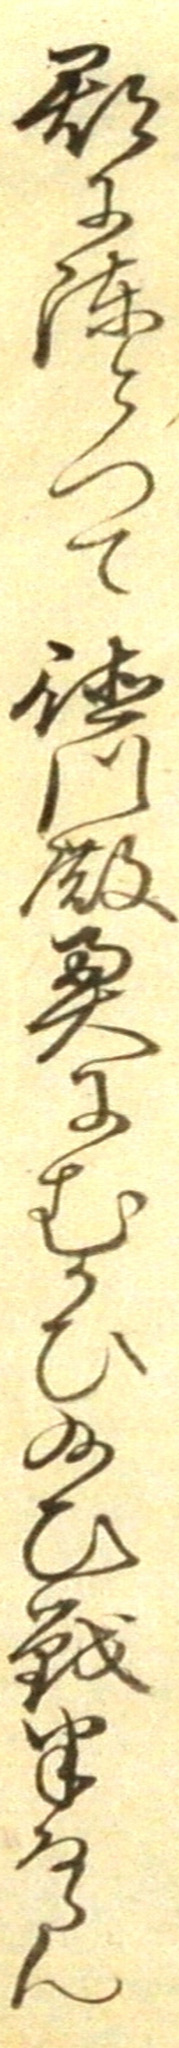郡に陣とつて徳川殿奥にむかひ給ひ戦半ならん
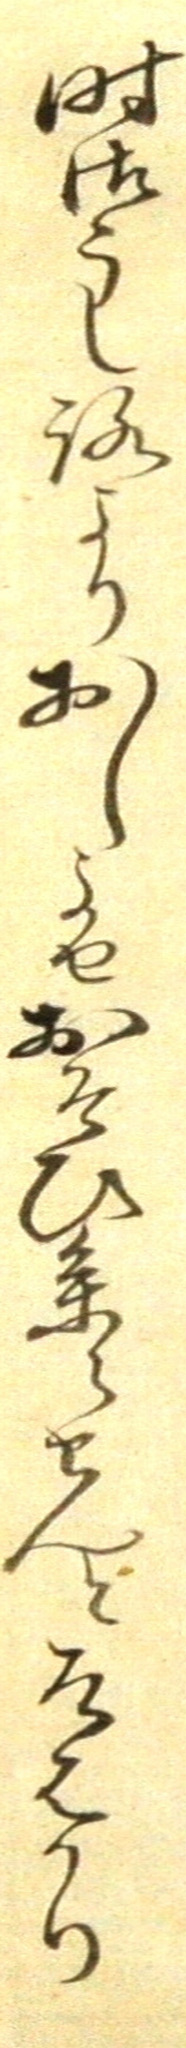時御うしろよりおしよせおそひ参らせんとそはかり
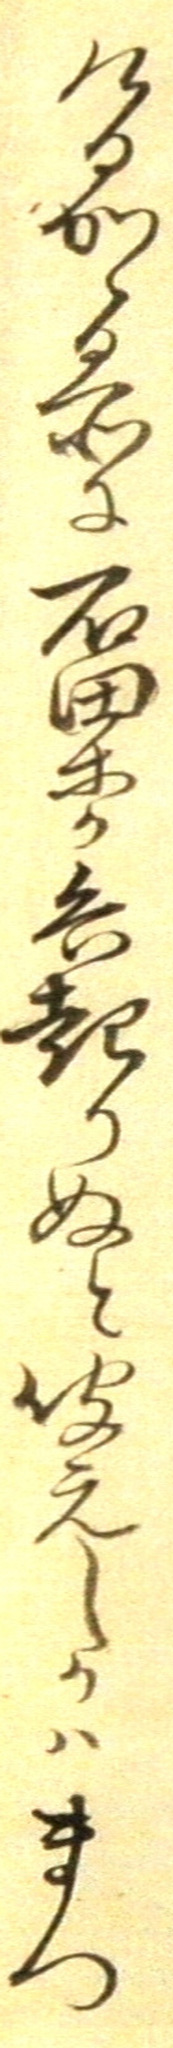けるかゝる所に石田等か兵起りぬと聞えしかはまつ

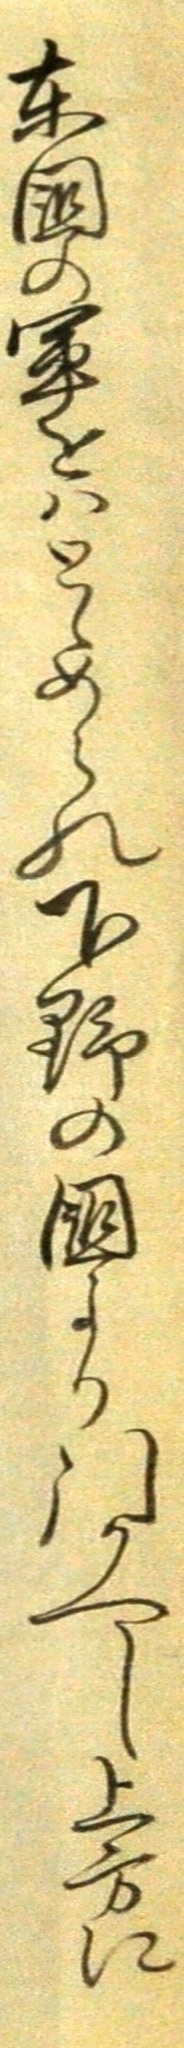東国の軍をはとゝめられ下野の国より引かへし上方に
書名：藩翰譜（八・下）
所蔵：伊那市立高遠町図書館・合同会社AMANE
